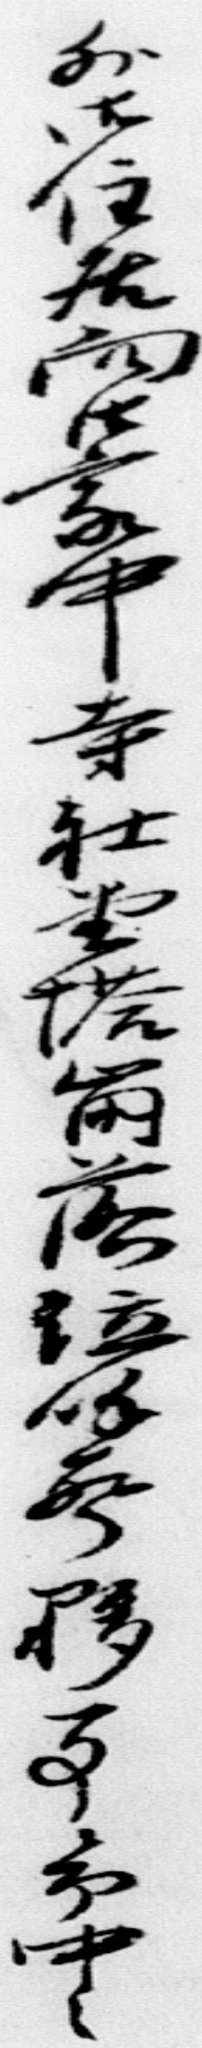外御住居向御家中寺社堂塔崩落泣呼声夥事に而中々
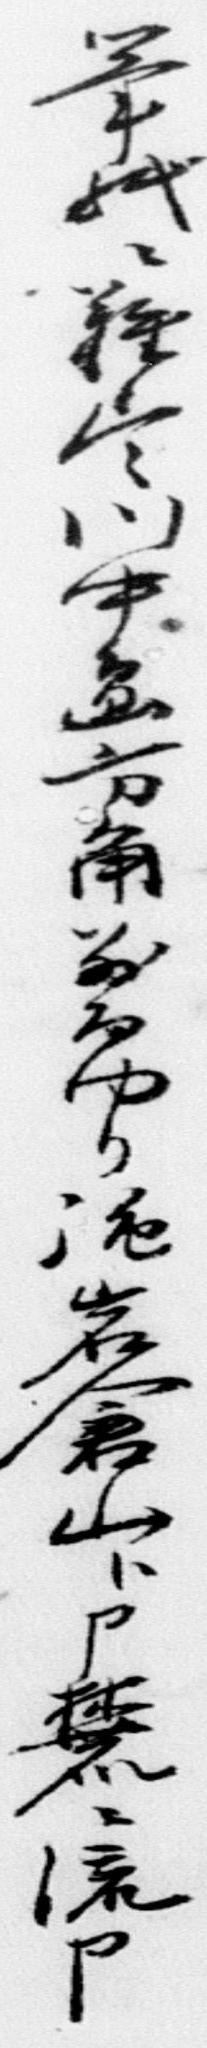筆紙に難尽川中島方角別而ゆり強岩倉山と申麓に流申
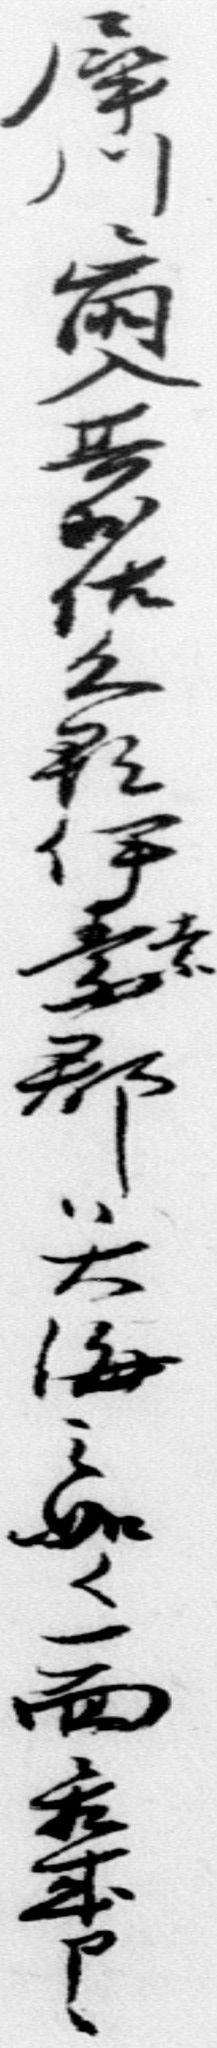犀川に崩入其外佐久郡伊素郡は大海之如く一面に相成申候
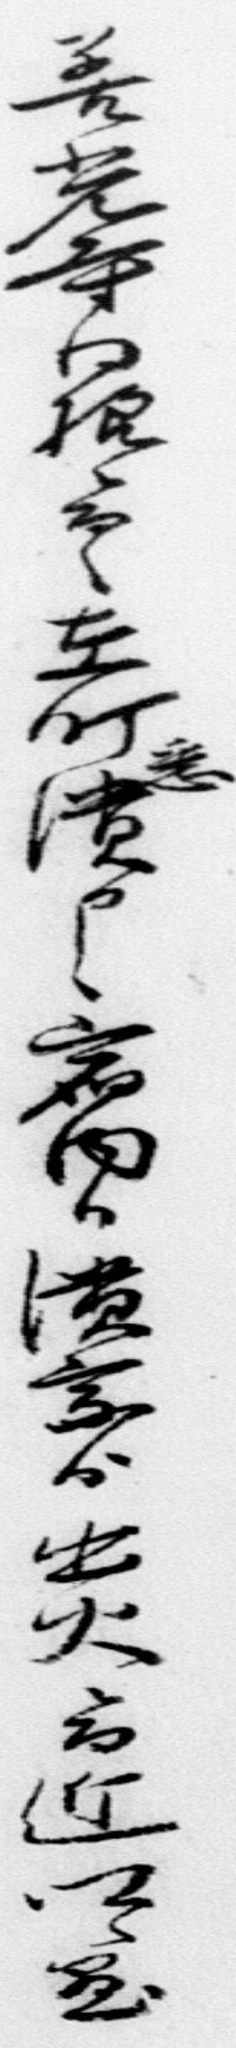善光寺同様に而候在町悉潰申候宿内は潰家ゟ出火に而近郷に懸
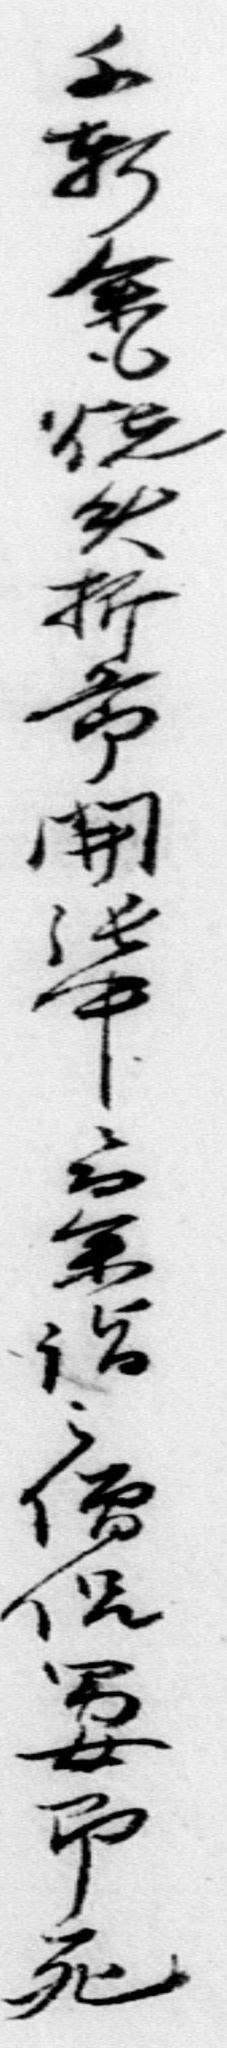千軒余も焼失折節開帳中に而参詣之僧侶男女即死
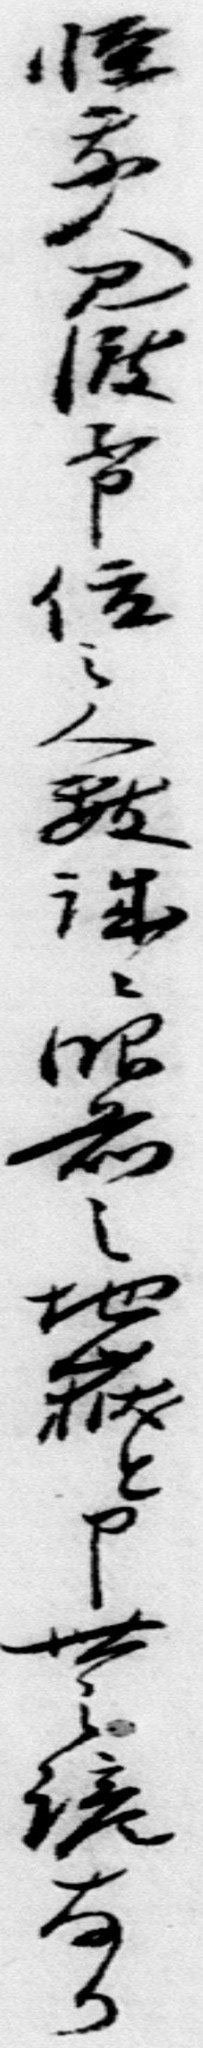怪我人見渡不申位之人数誠に眼前之地獄と申世之諺なり
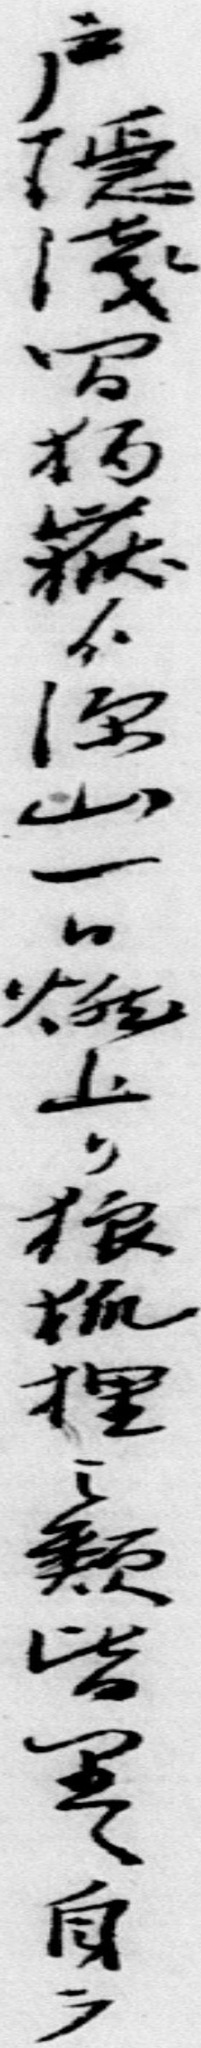戸隠浅間狛嶽ゟ深山一日燃上り狼狐狸之類皆里へ自ら
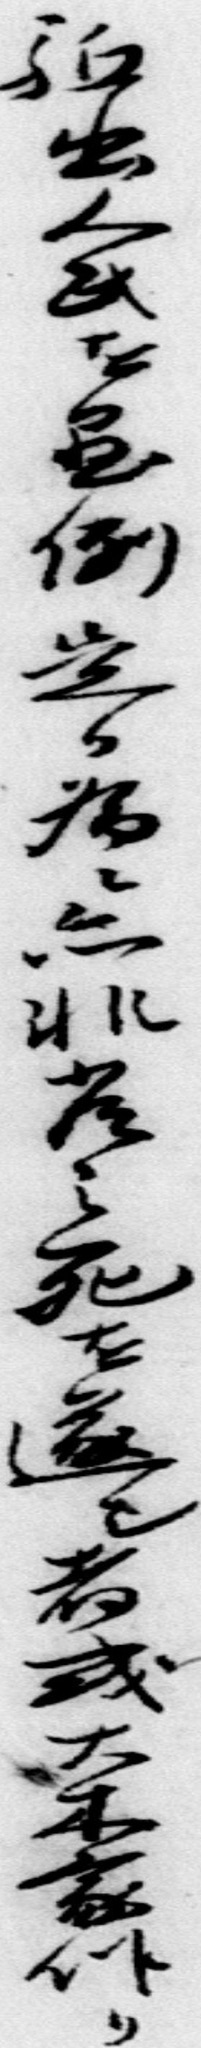駆出人民を懸倒走る為に亦非常之死を遂し者或大木家作り

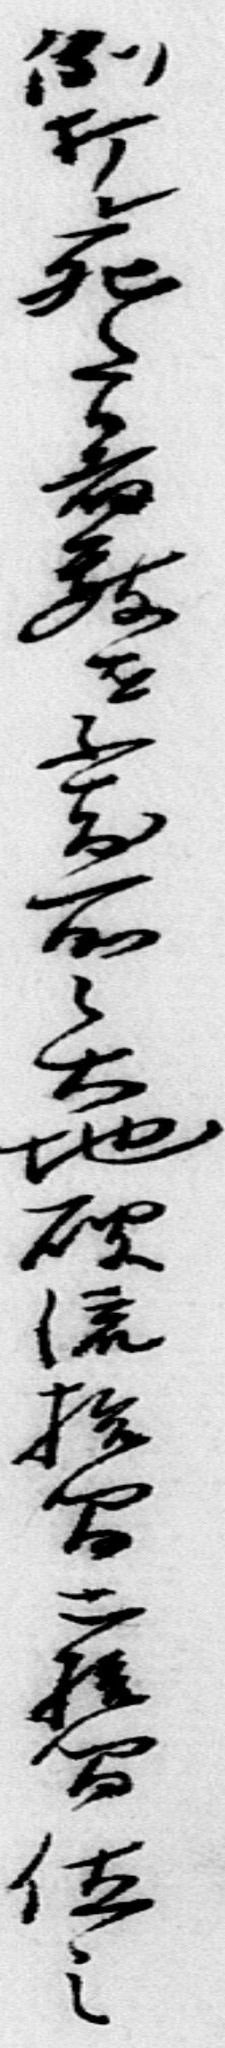倒打れ死たる者数を不知所々大地破流拾間二拾間位之
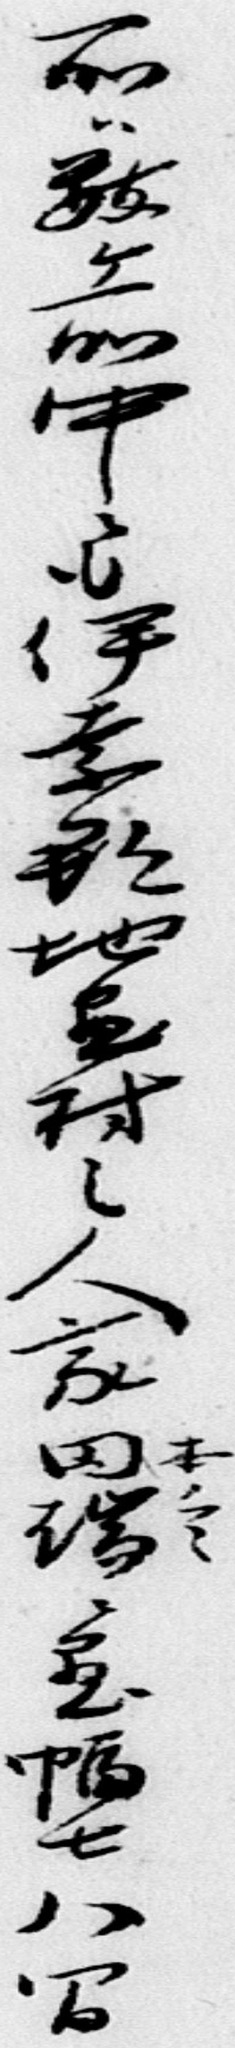所は数ケ所中にも伊奈郡地懸村々人家田端に懸幅七八間
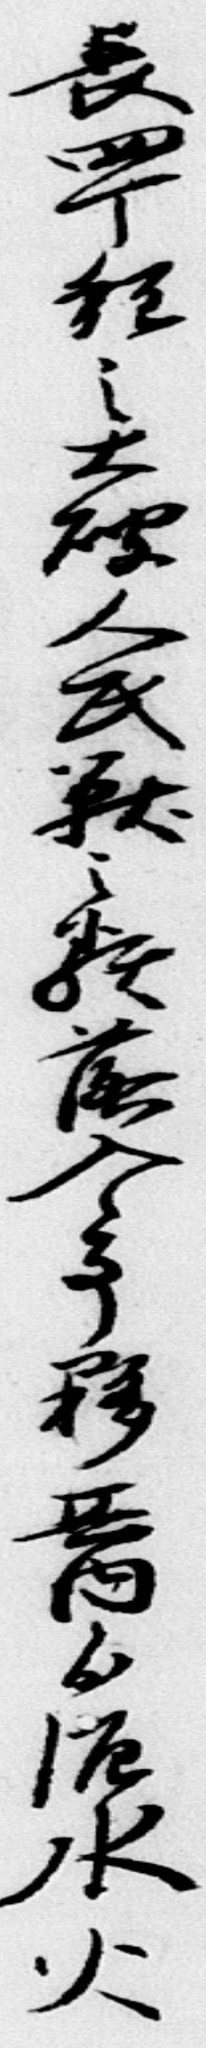長四丁程之大破人民獣之類落入候事夥其内ゟ泥水火
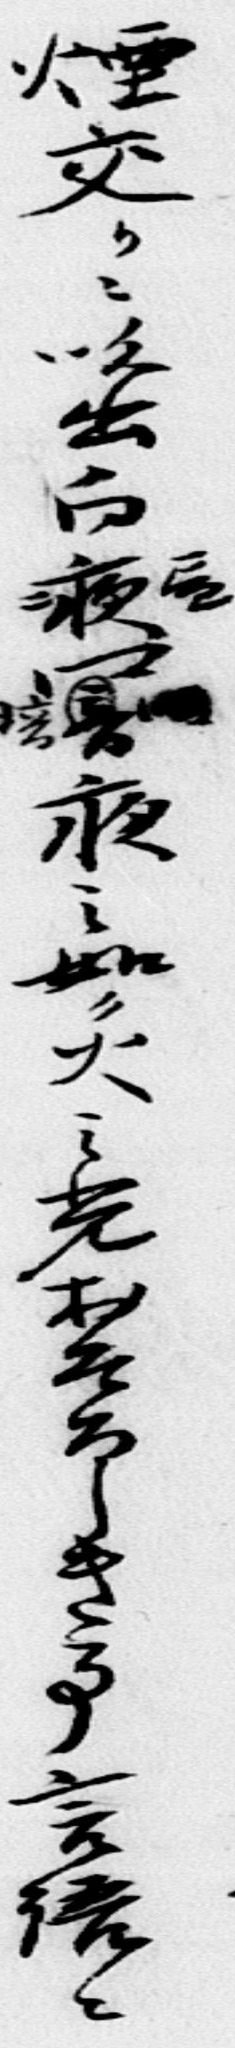煙交りに吹出白昼闇夜之如く火之光おそろしき事言語に
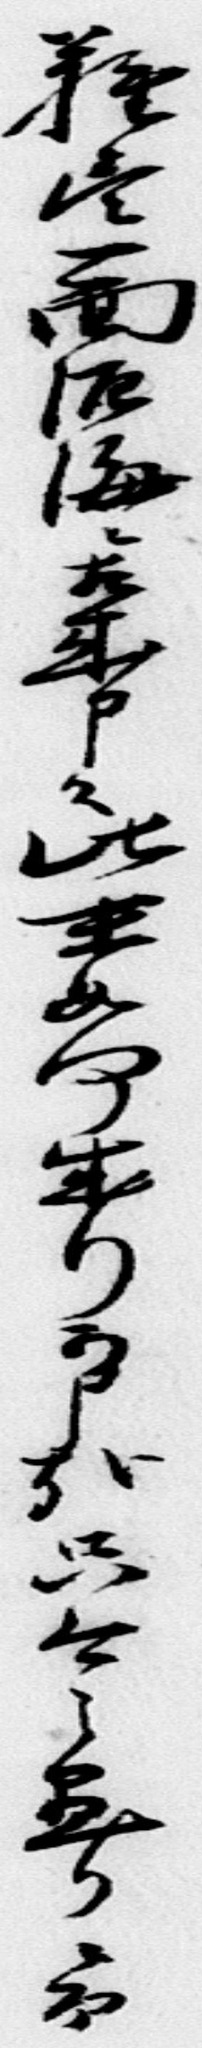難尽一面泥海に相成申候此末如何成り可申哉只今の懸りに而
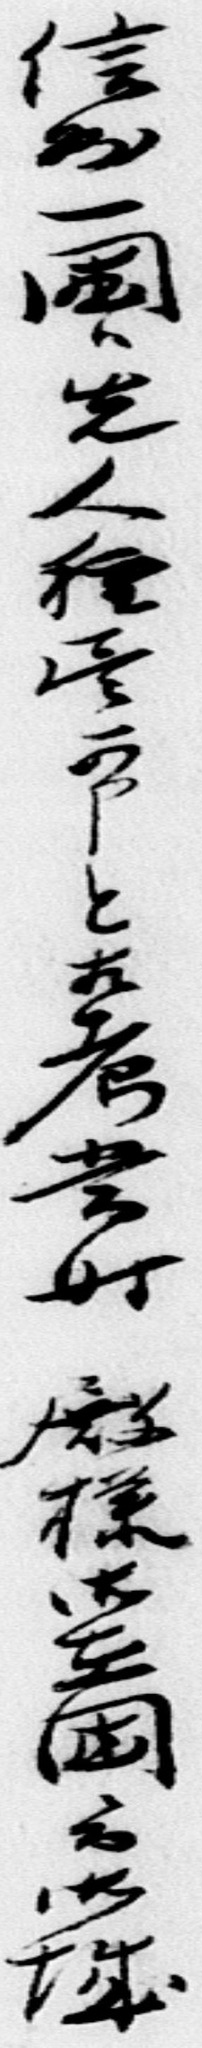信州一国は先人種尽可申と相考当時殿様御在国に而御城
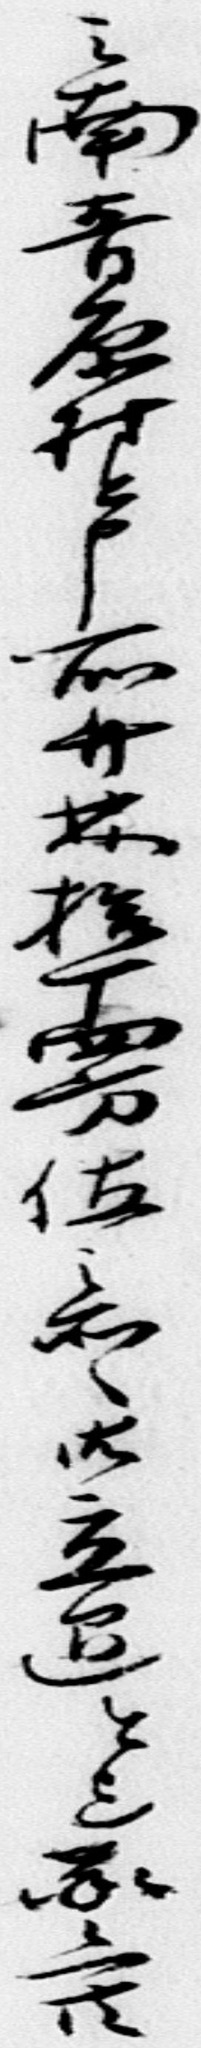之南青原村と申所竹林拾丁四方位之所へ御立退と迄承候へ共
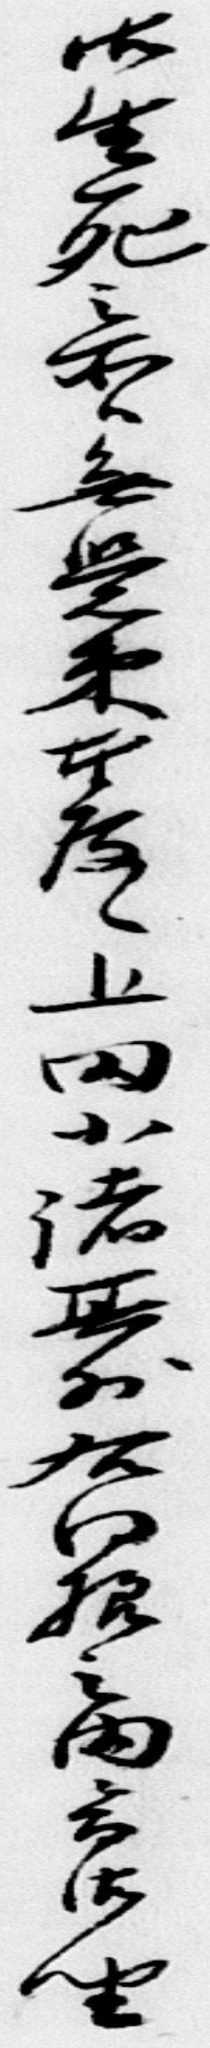御生死之所は無覚束奉存候上田小諸其外右同様之由に而御座
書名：信州大地震一件
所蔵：徳島県立図書館
